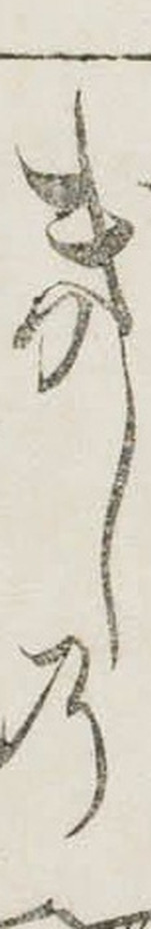きしの
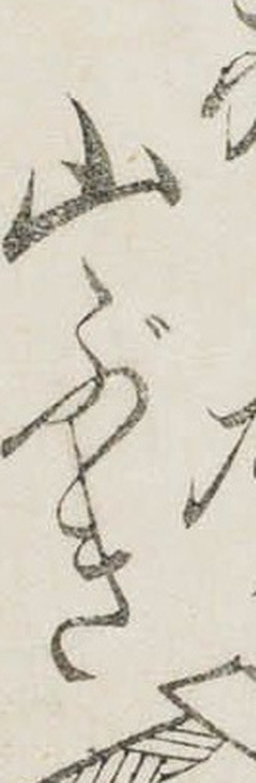山ぶき
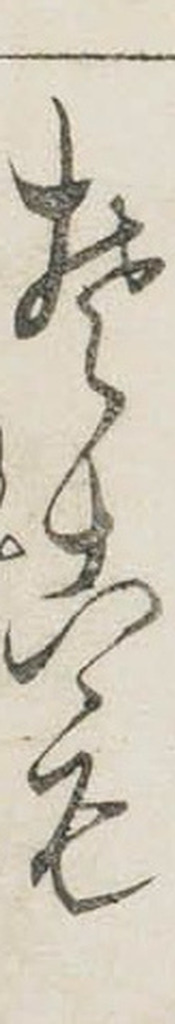そこも
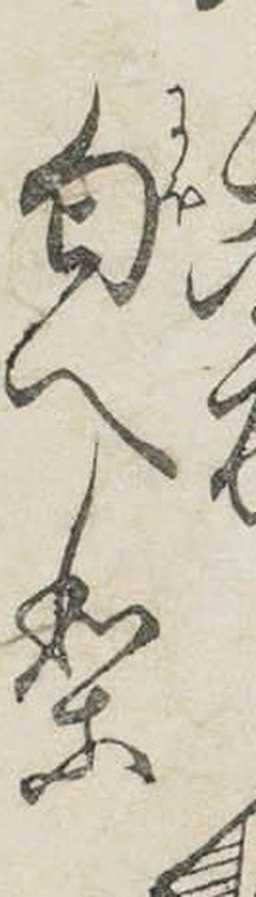匂へり

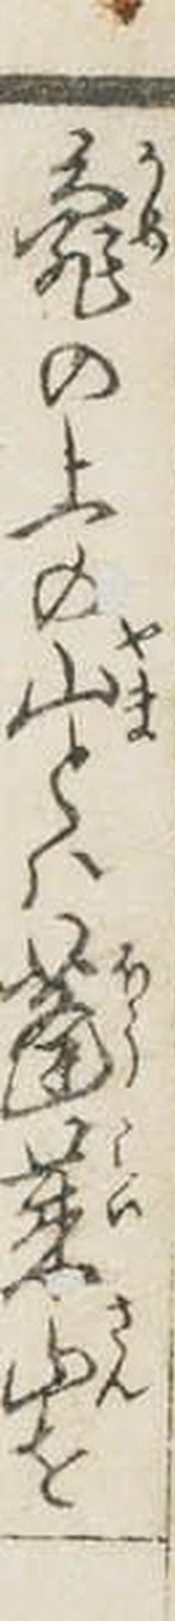亀の上の山とは蓬莱山を
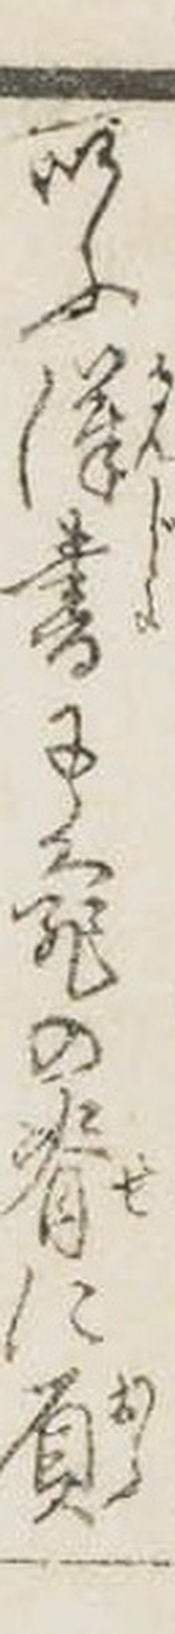いふ漢書に亀の脊に負
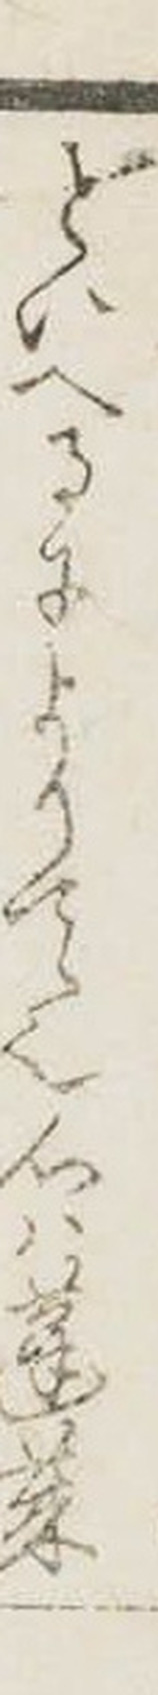といへるによりて也心は蓬莱
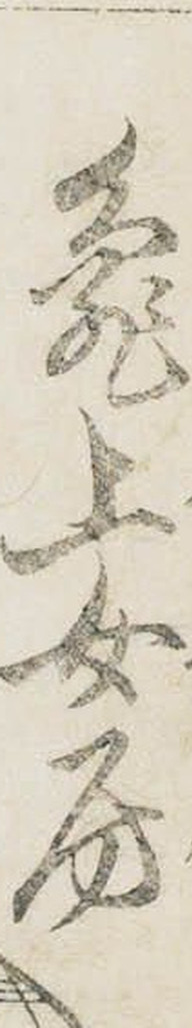亀上女房
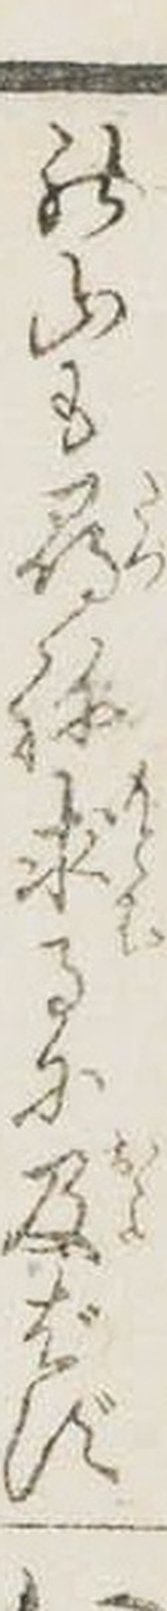の山も尋ね求るに及ばず
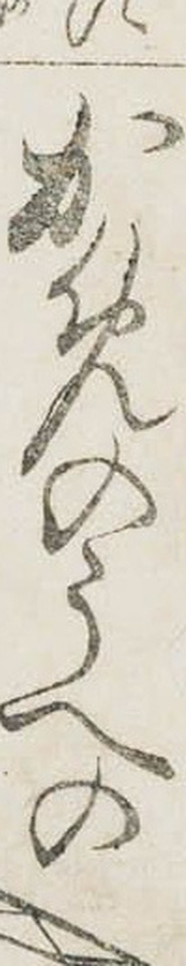かめのうへの
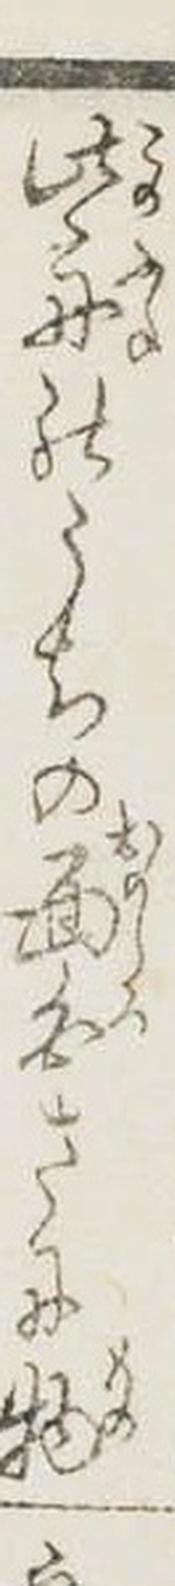此舟のうちの面白さに物
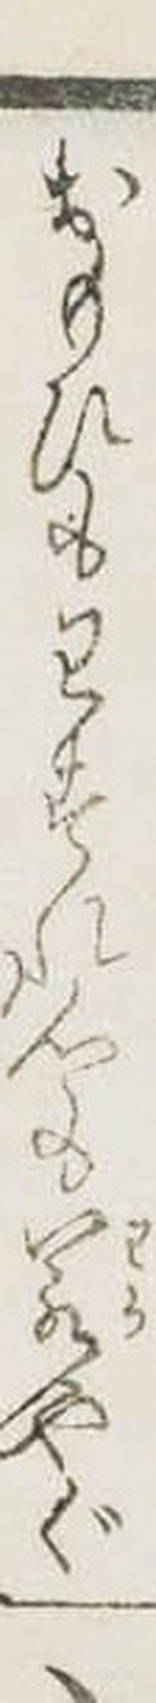おもひもわすれ心も若やぐ
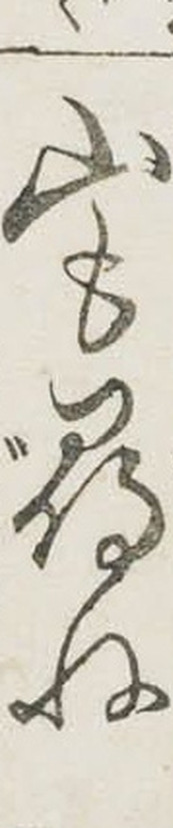山も尋ね
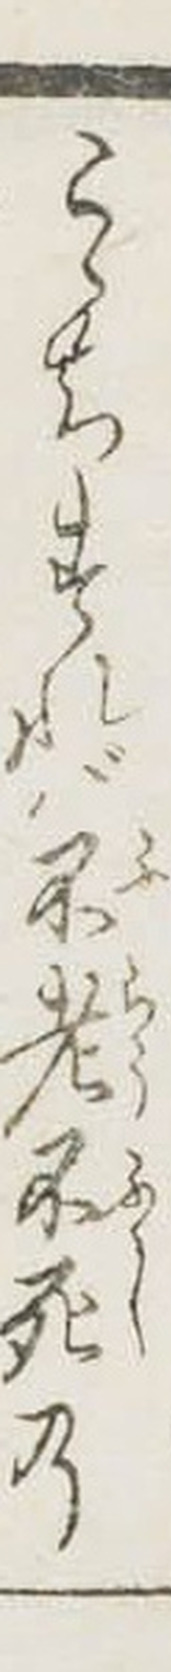こゝちすれば不老不死の
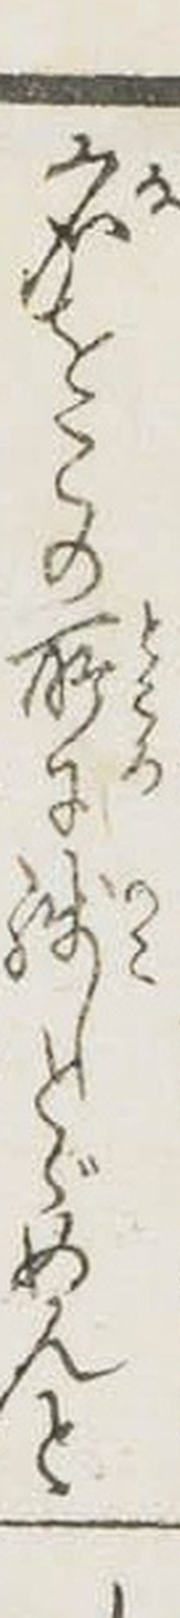名をこの所に残しとゞめんと
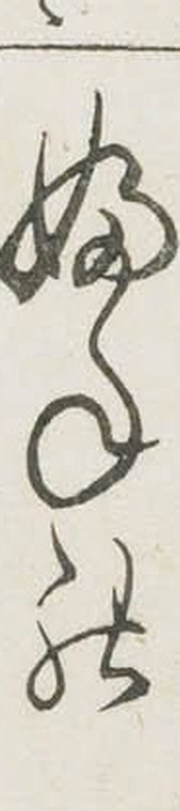ふねの
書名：源氏百人一首
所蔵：東京学芸大学教育コンテンツアーカイブ
